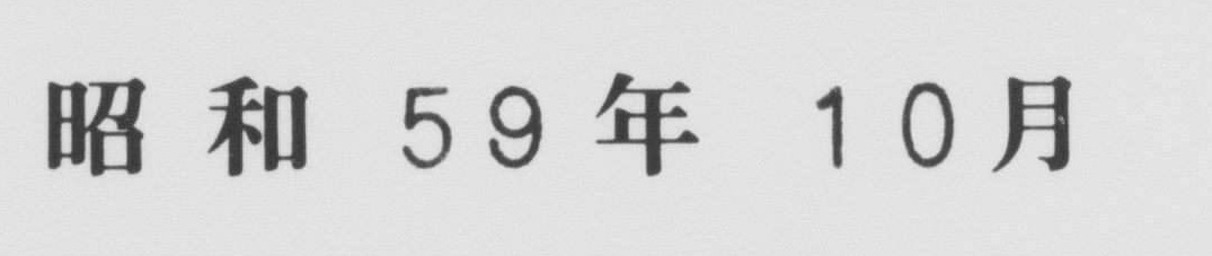昭和年月
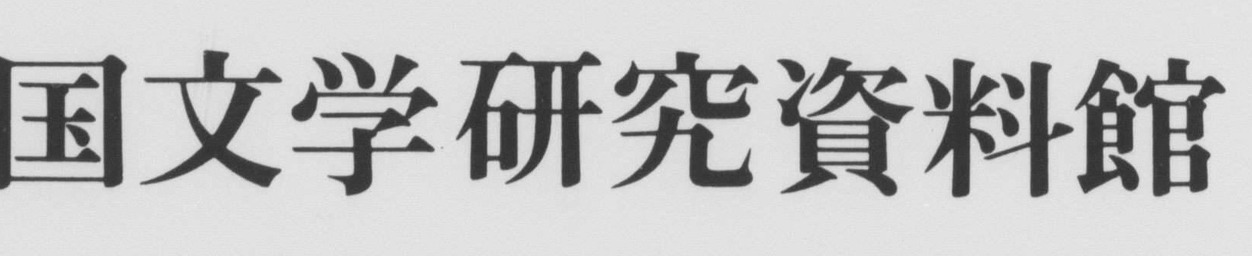国文学研究資料館
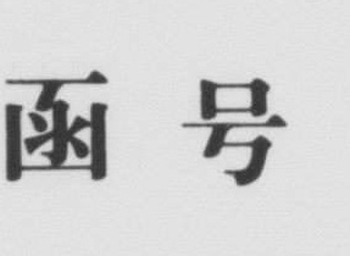函号-

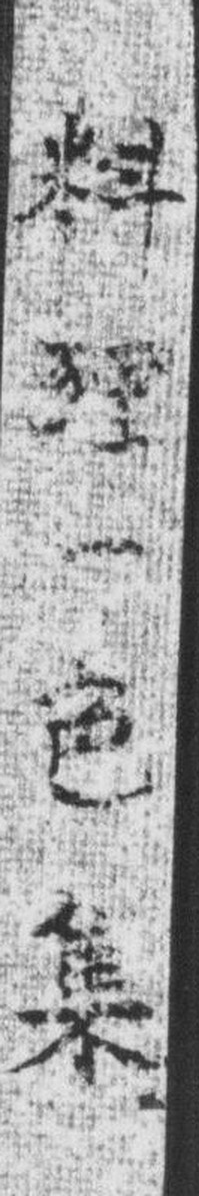料理一色集
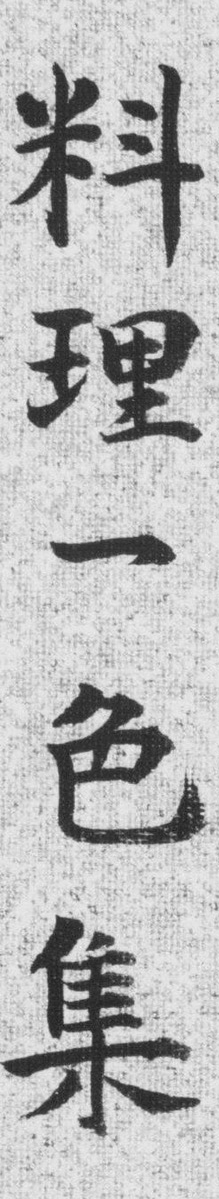料理一色集

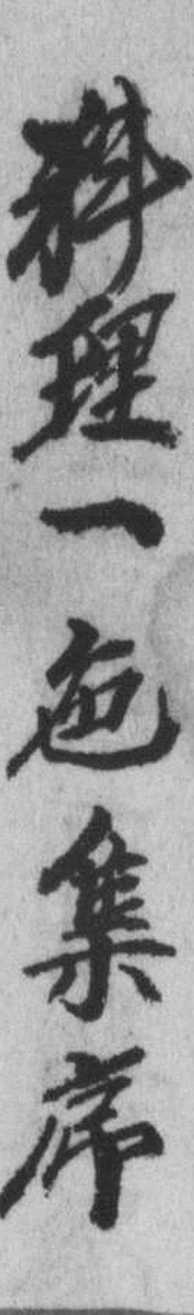料理一色集序
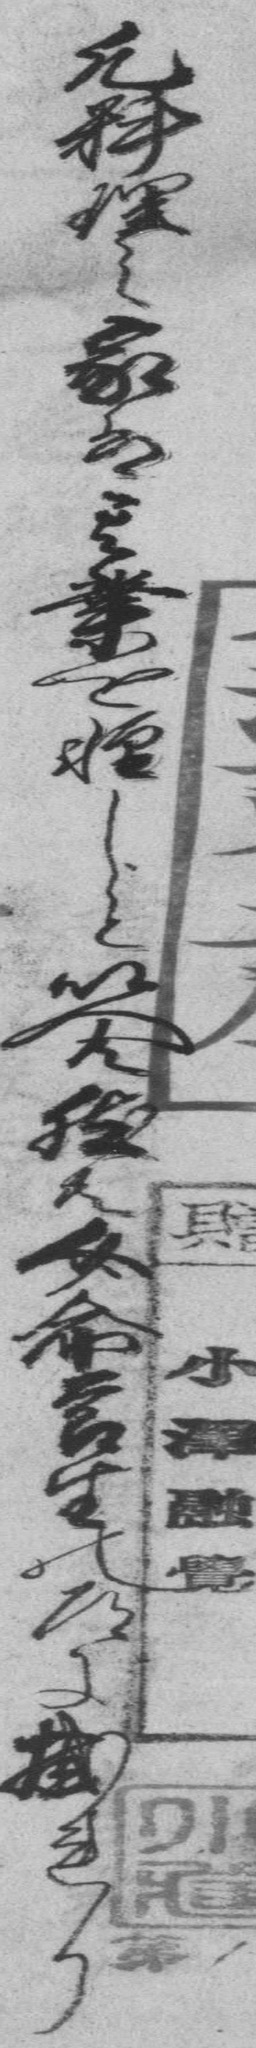凡料理之家は其業を軽しゝといへ共然共人命養生の道に掛れり
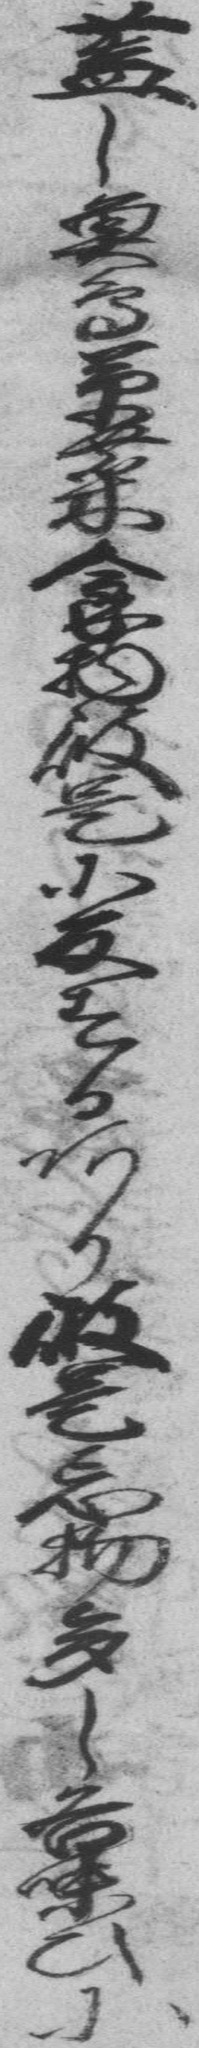蓋し魚鳥草菜食物彼是に友するあり彼是忘物多し各味ひに
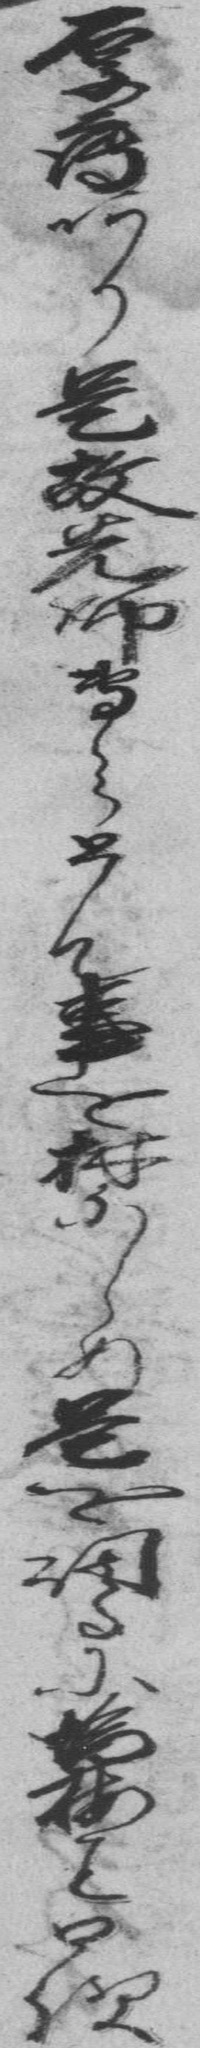厚薄あり是故先師専ら事を払ふしめ是を調るに塩梅を口授
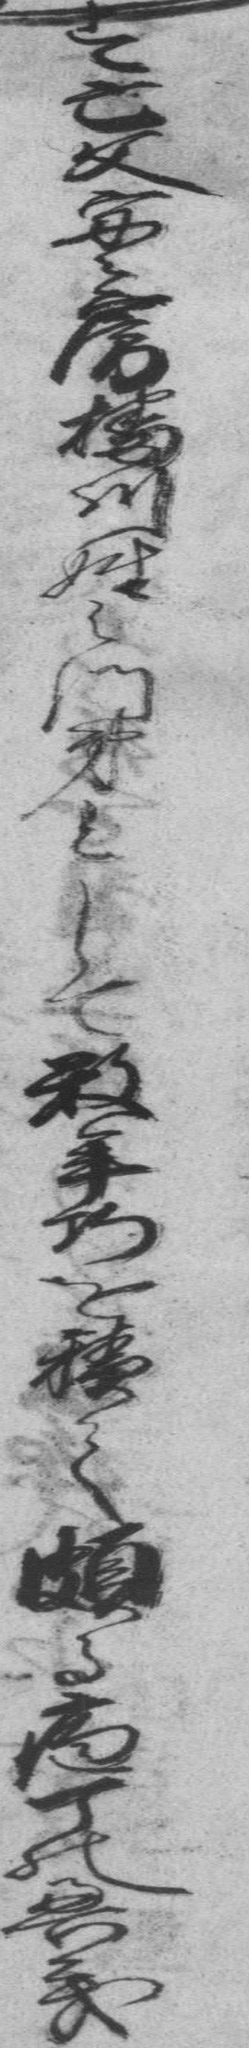す亡父実房橘川姓之門弟として数年功を積て頗る庖丁の奥義
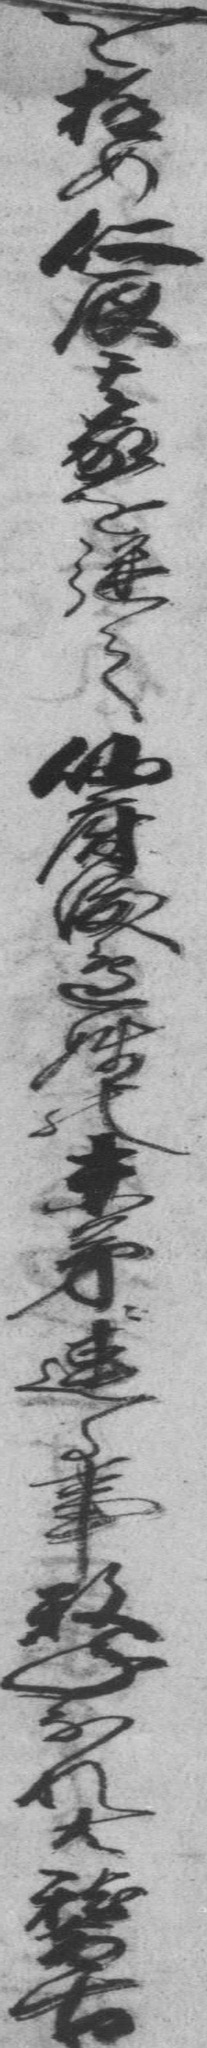を極め仁辰其家を継て仙府渡邊姓の末弟連る事数年なれ共稽古

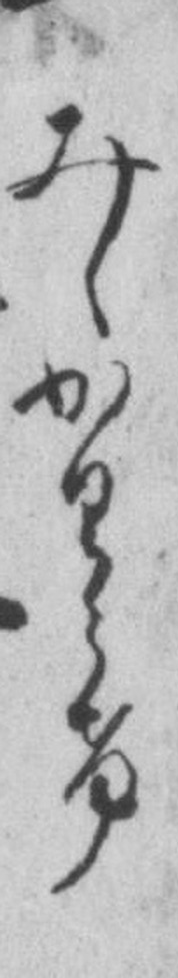みゝかわらけ
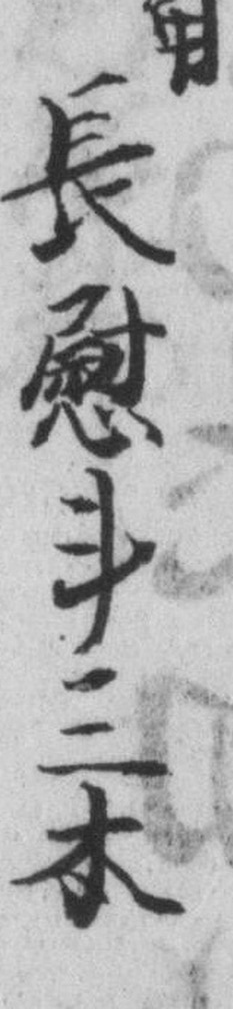長熨斗三本
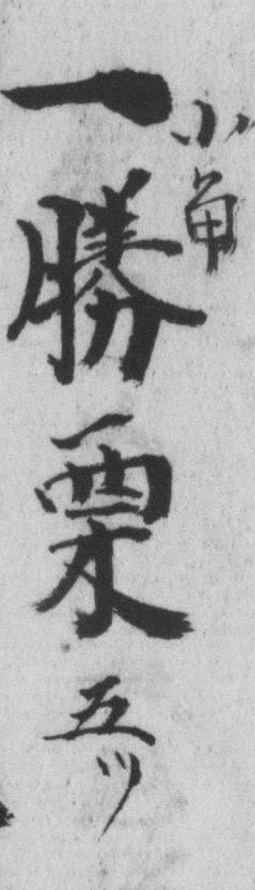一勝栗五つ
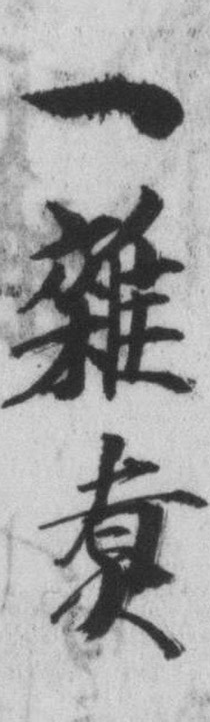一雑煮
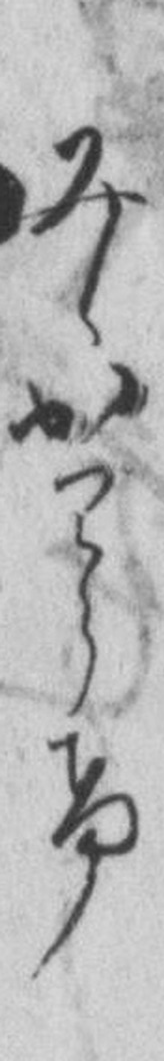みゝかわらけ
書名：料理一色集
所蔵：大阪府立大学学術情報センター 国文学研究資料館
